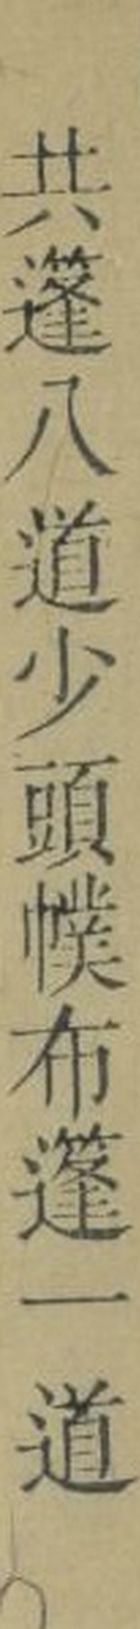共篷八道少頭幞布篷一道
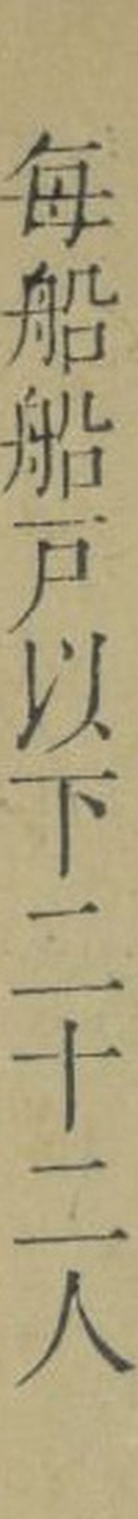每船船戸以下二十二人
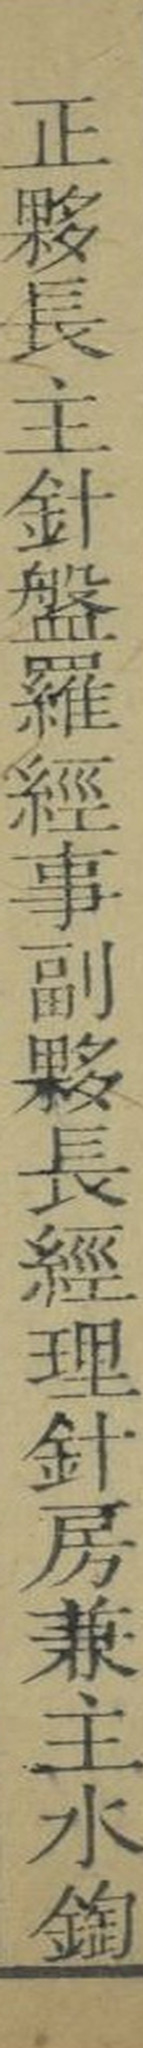正夥長主針盤羅經事副夥長經理針房兼主水鋾
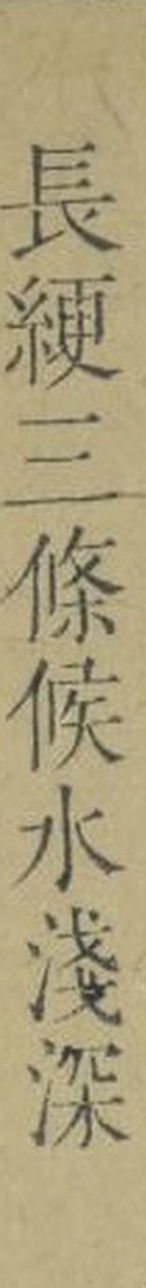長綆三條候水淺深
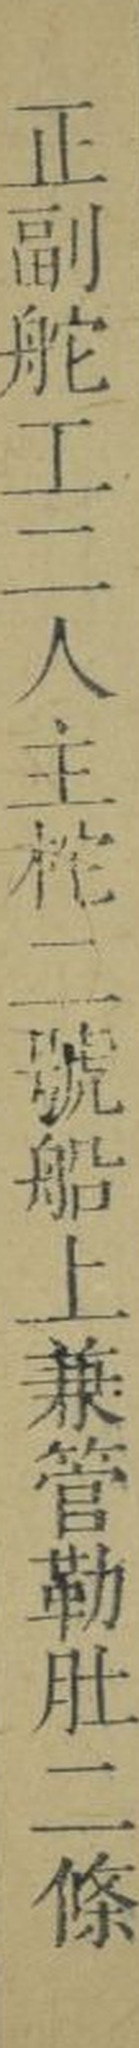正副舵工二人主柁二號船上兼管勒肚二條
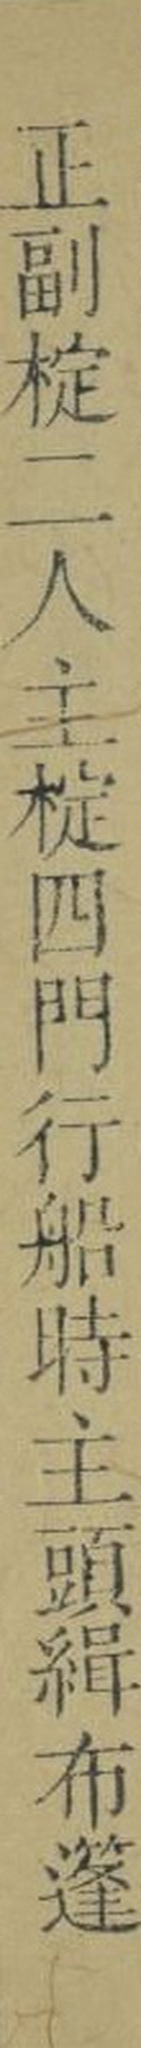正副椗二人主椗四門行船時主頭緝布篷
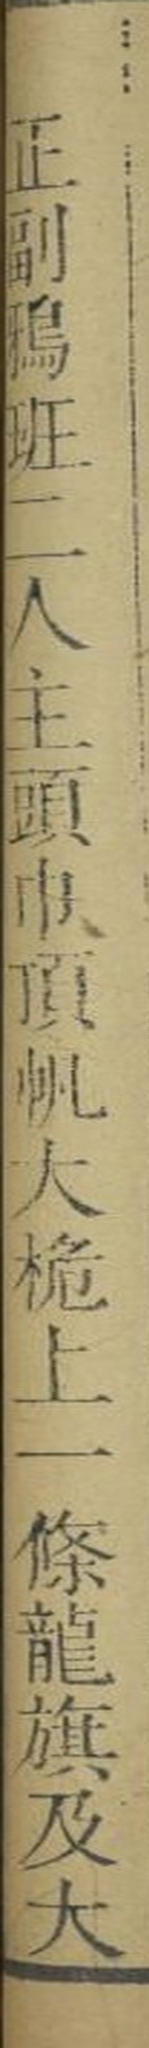正副鴉班二人主頭巾頂帆大桅上一條龍旗及大
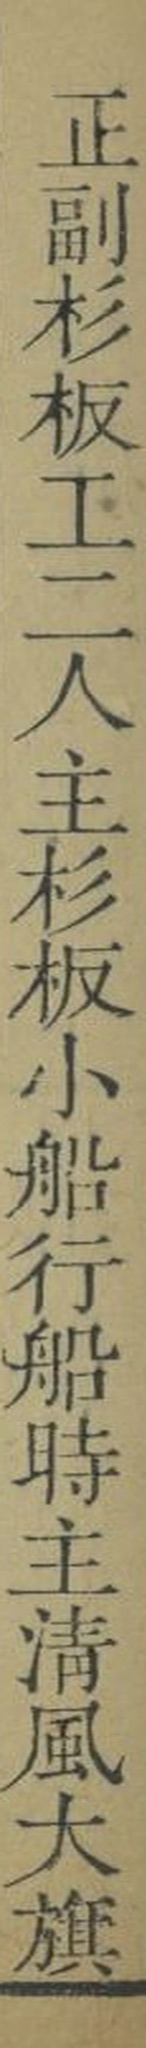正副杉板工二人主杉板小船行船時主淸風大旗
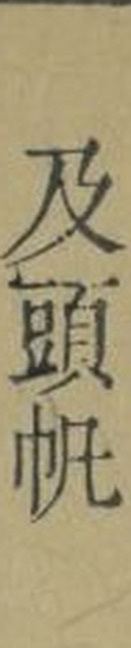及頭帆
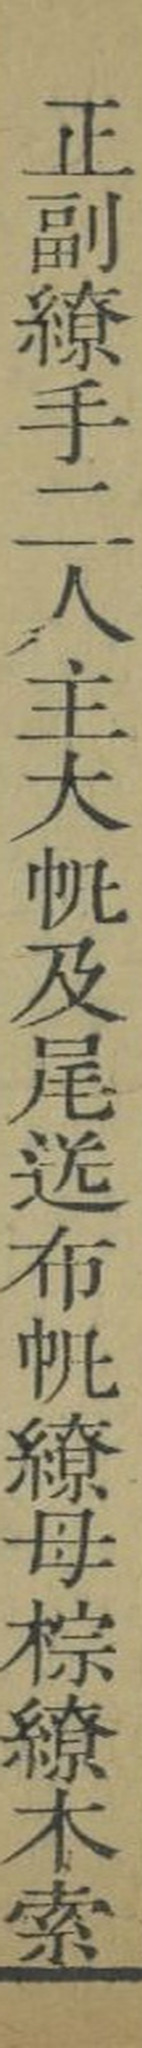正副繚手二人主大帆及尾送布帆繚母棕繚木索
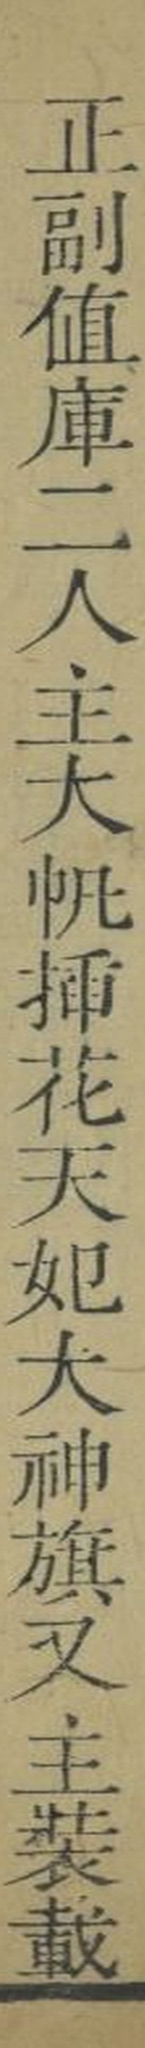正副値庫二人主大帆揷花天妃大神旗又主裝載
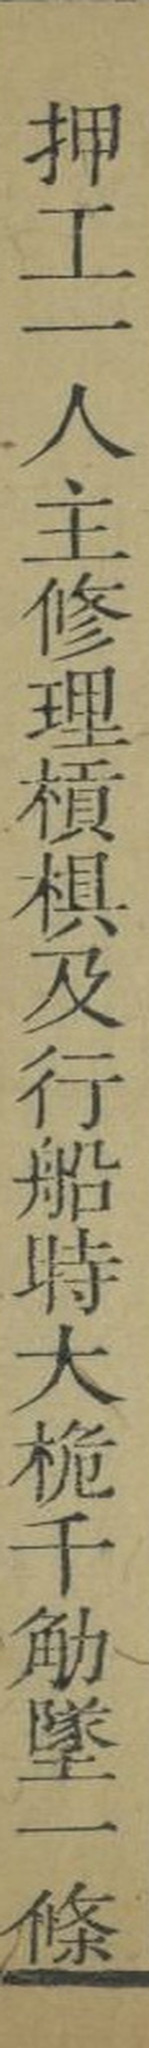押工一人主修理槓椇及行船時大桅千觔墜一條
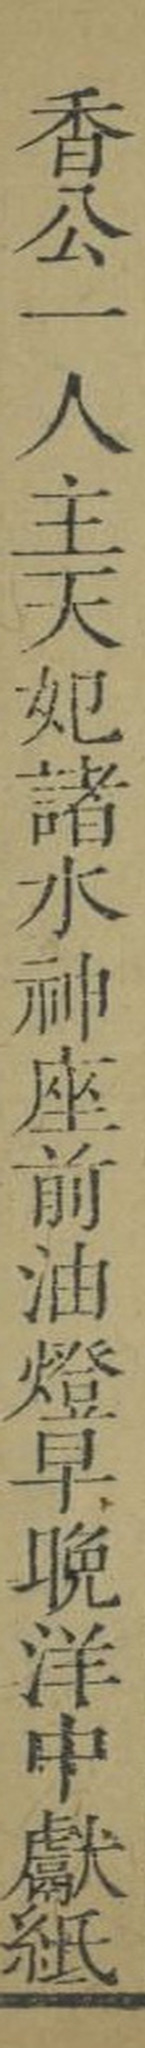香公一人主天妃諸水神座前油燈早晩洋中獻紙
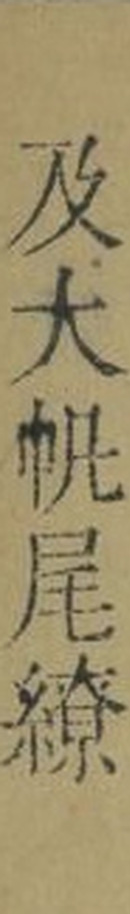及大帆尾繚

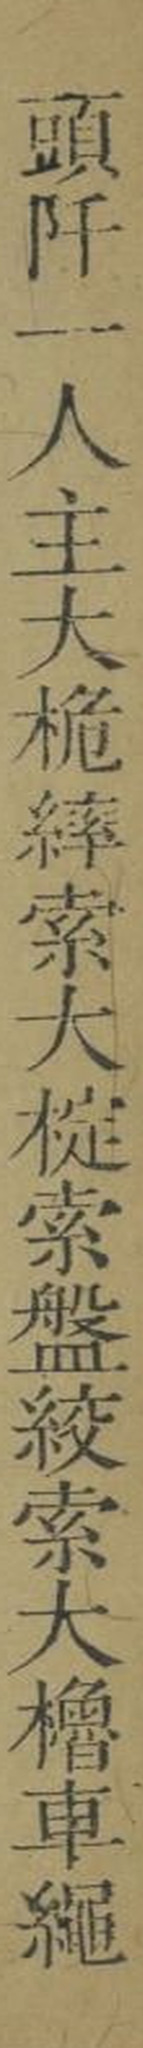頭阡一人主大桅繂索大椗索盤絞索大櫓車繩
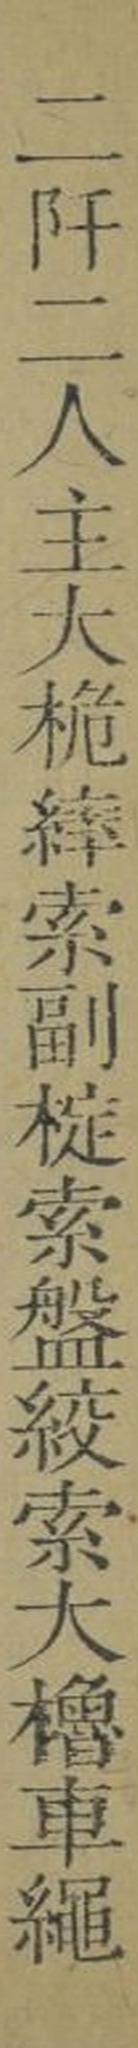二阡二人主大桅繂索副椗索盤絞索大櫓車繩
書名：中山伝信録 巻一
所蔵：University of the Ryukyus Library
